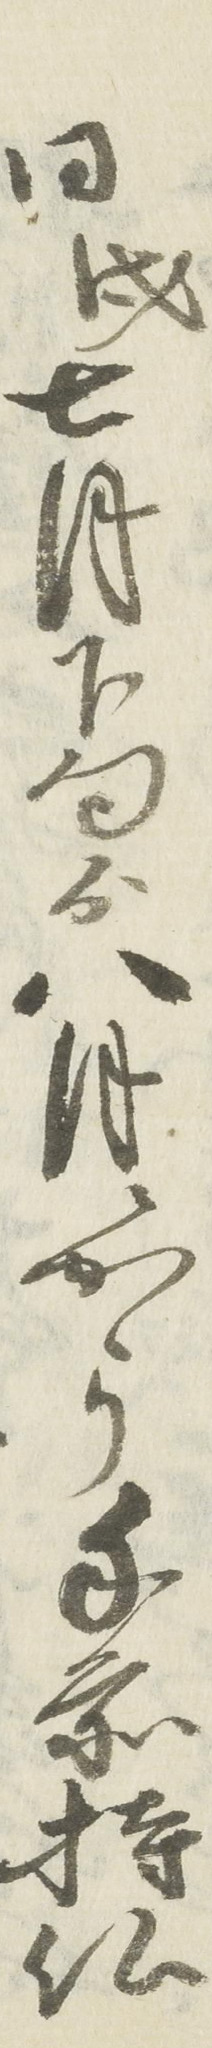一同戌七月下旬ゟ八月ニかゝり手前持仏
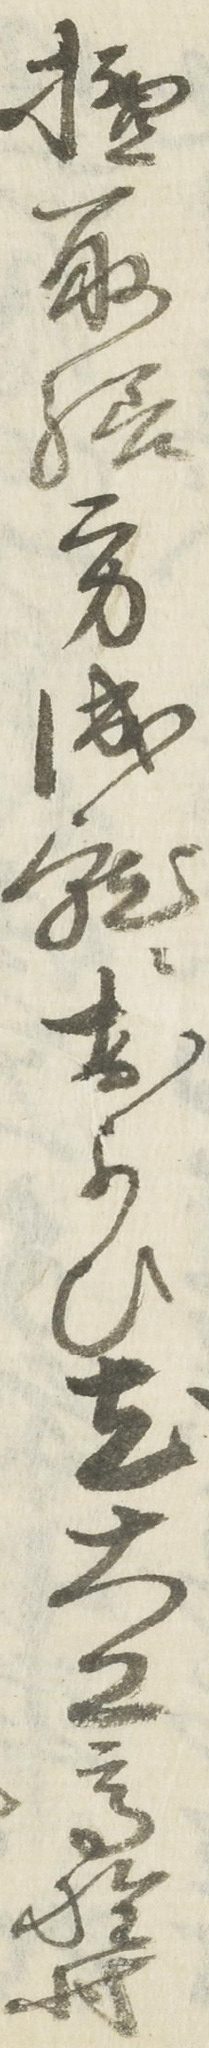壇取繕方成就ニおよひ尤大工高野村
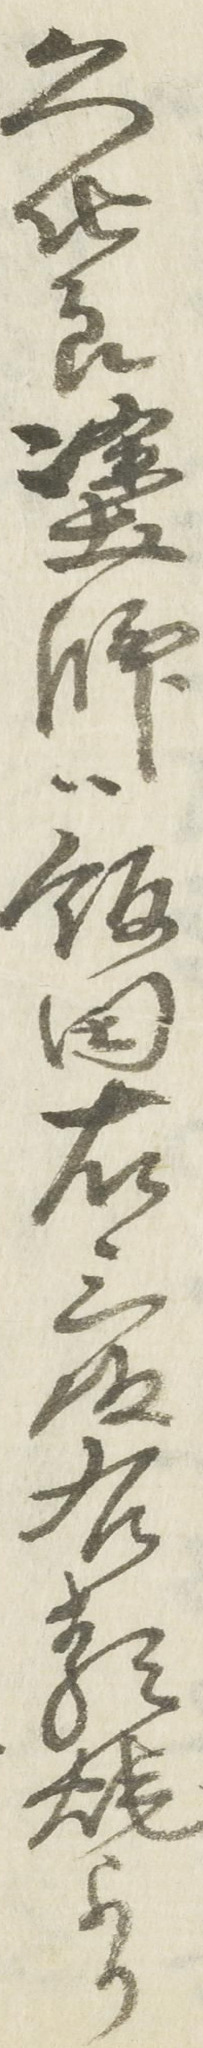久次郎塗師は飯田右三殿右類焼より
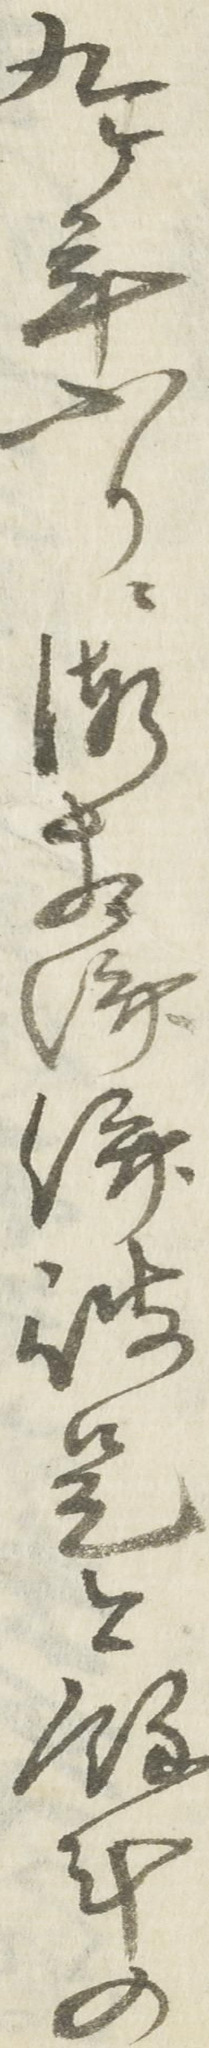九ヶ年ふりニ漸相済併彼是と余計の
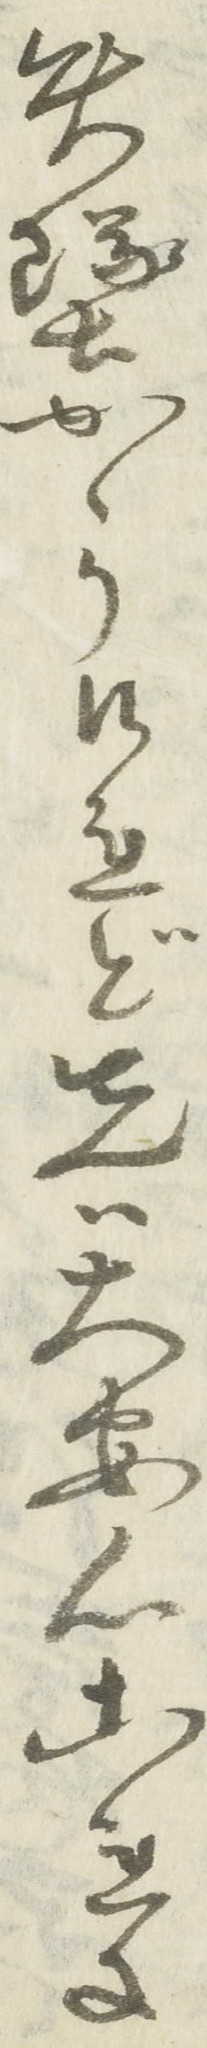失墜かゝりけれど先は大安心これに
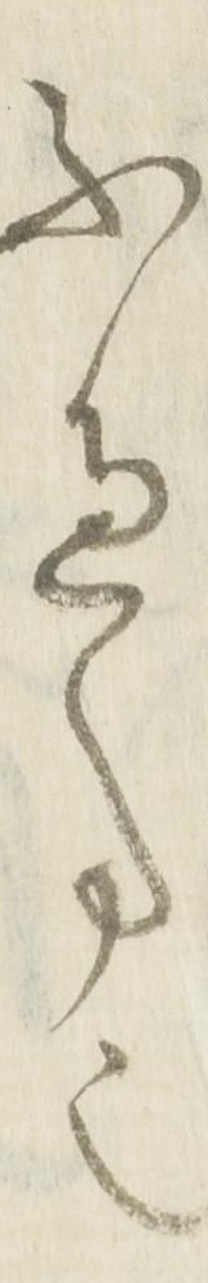不過事也
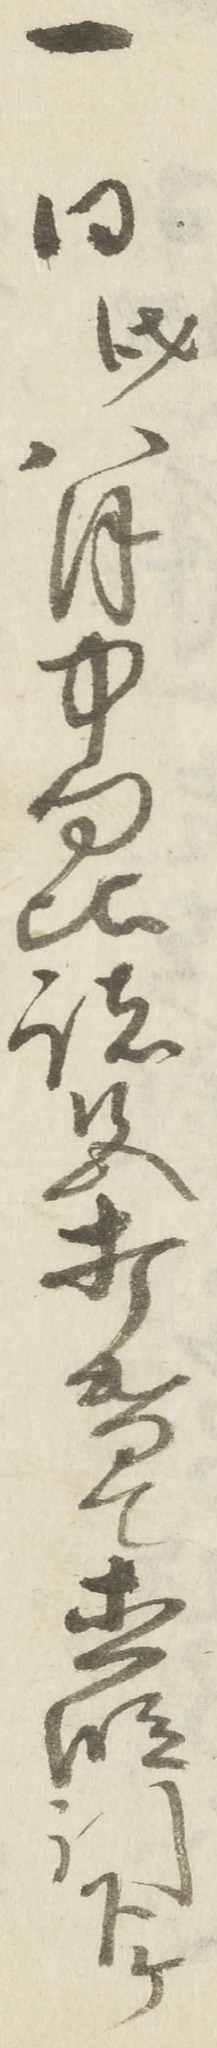一同戌八月中旬比諸色打替て直段引下ケ
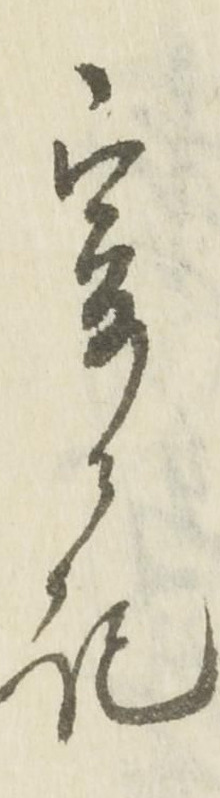爰ニ記
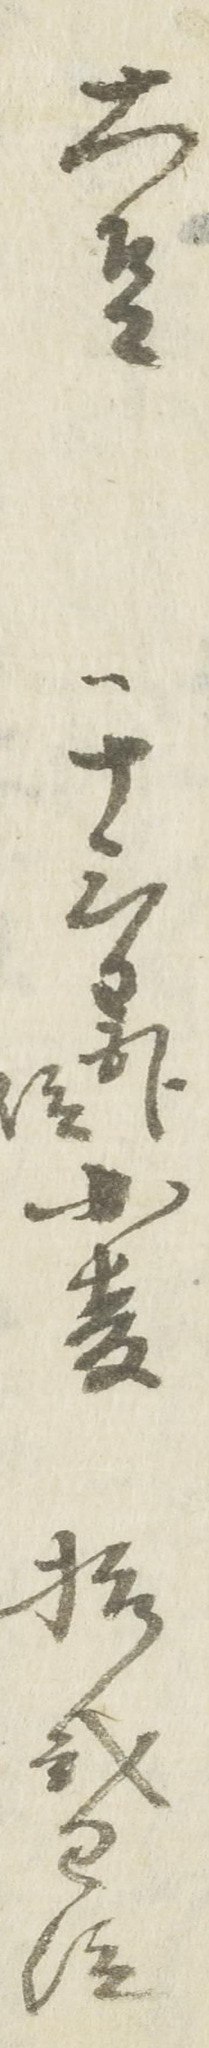大豆〃十三匁五分位小麦拾弐匁位
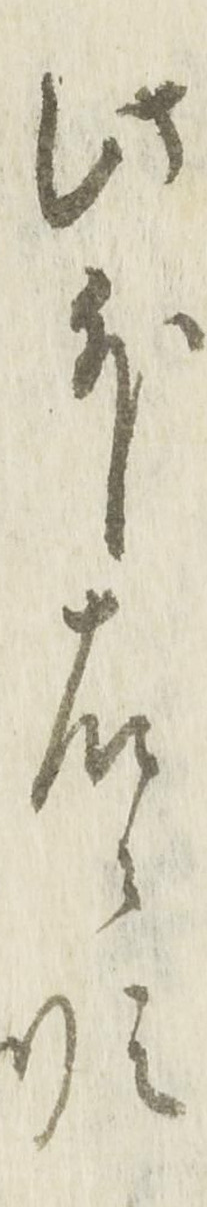此外右ニ順
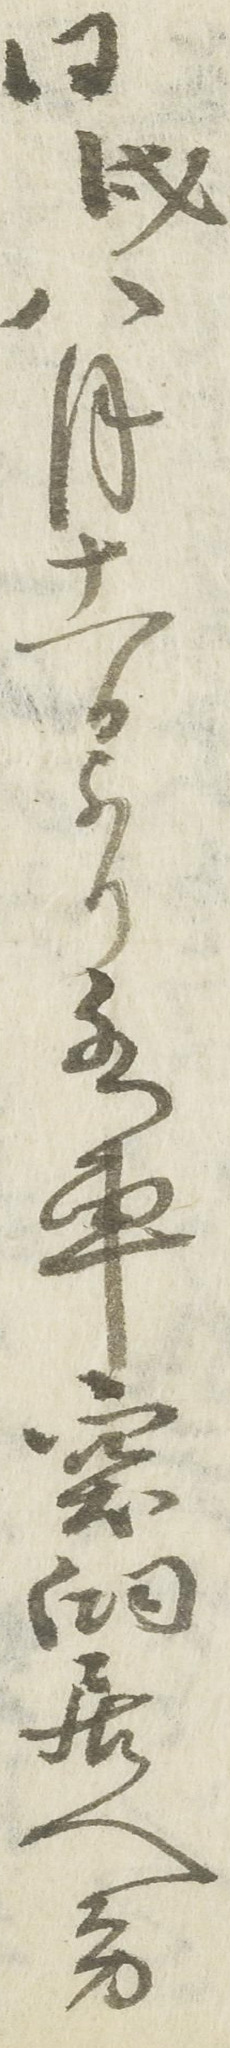一同戌八月十一日より水車突臼居へ方
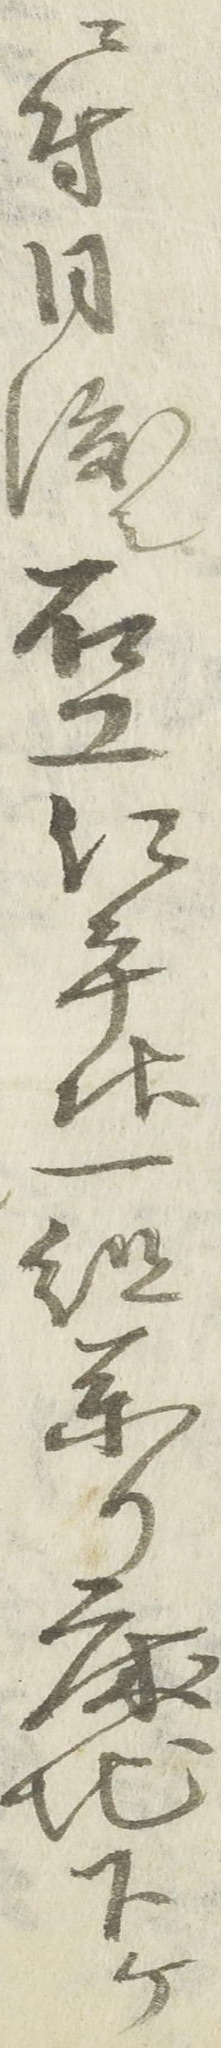ニ付日渡シ石工仁平次一組参り床地下ケ
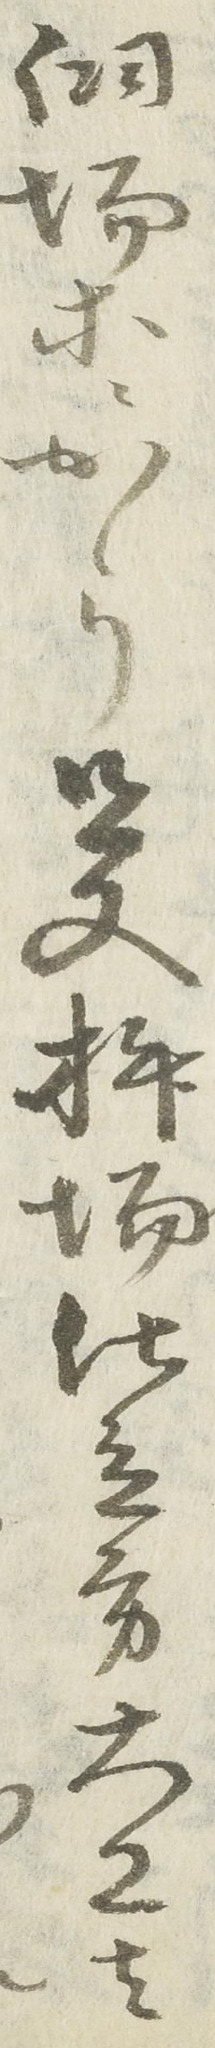臼場等ニかゝり且又杵場仕立方大工は
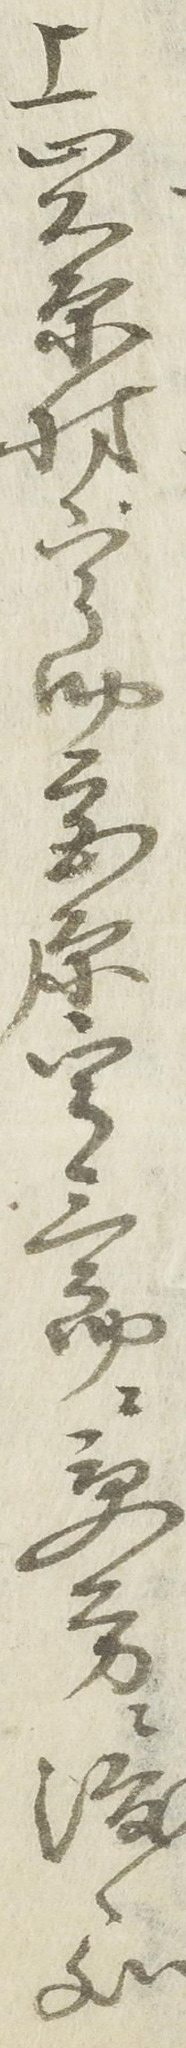上岩原村宇助宮原宇三郎ニ受方ニ渡候処
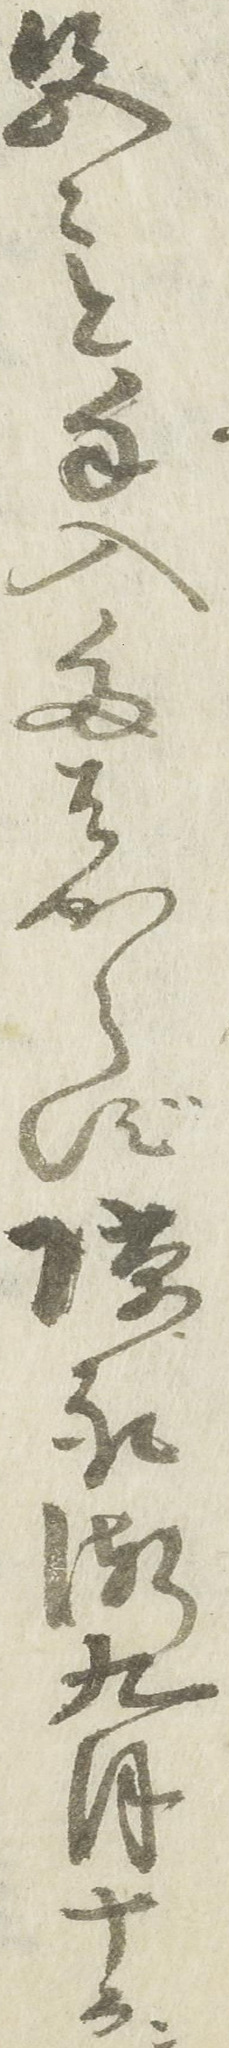色〻と手入多はからず隙取漸九月十日ニ
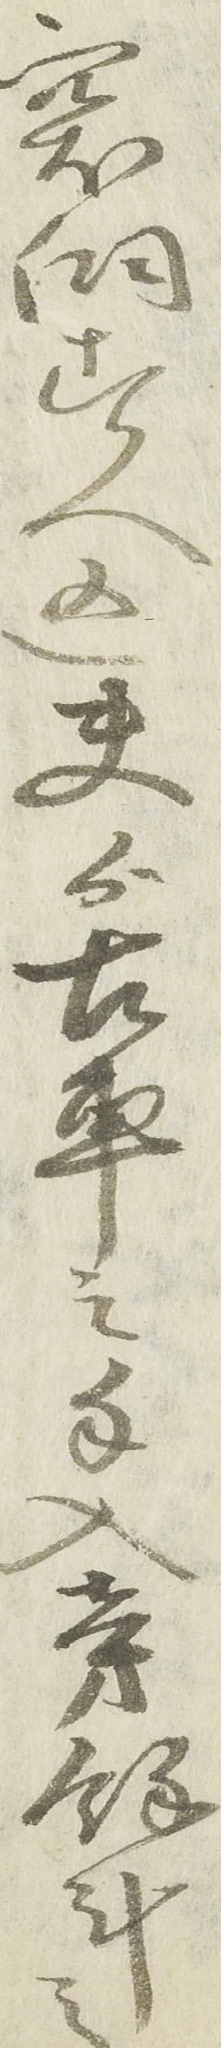突臼すへ込夫ゟ古車之手入旁余計之
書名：後見笑
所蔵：東京大学地震研究所図書室 Earthquake Research Institute Library, The University of Tokyo, JAPAN
